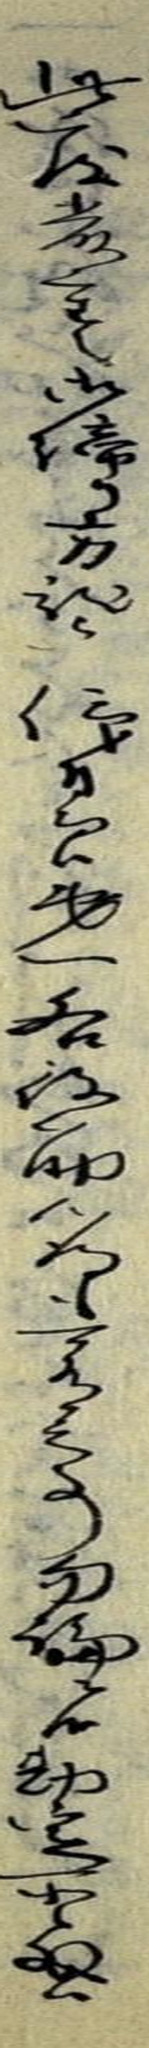此度厳重之御締り方就被仰付而は第一各役筋心得も可有之事勿論に候勘定所之義は
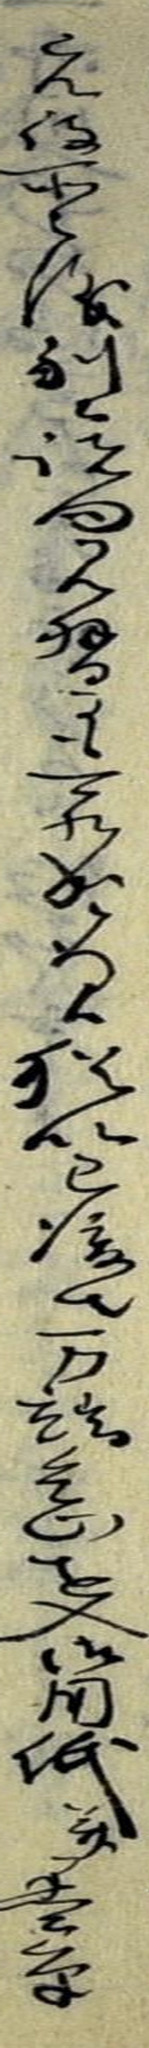元役所之儀別而諸向見習にも可相成候得は猶以已後は万端念を入御用紙并墨筆
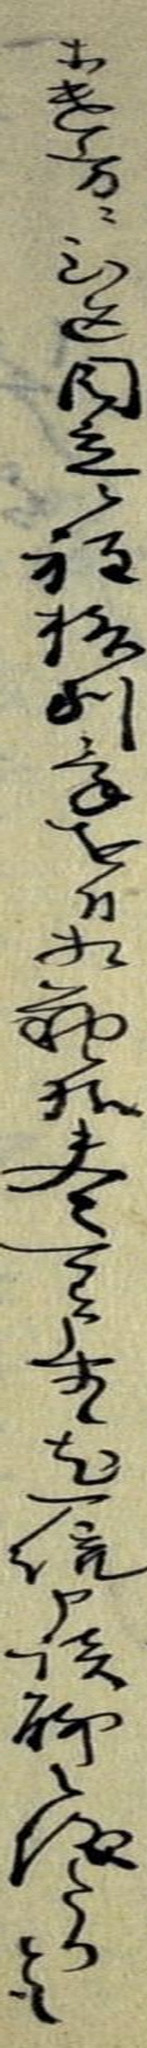相遣方に至迄目立候程格別気を付相勤候様夫々可被申聞候尤一統申談聊之儀たりとも
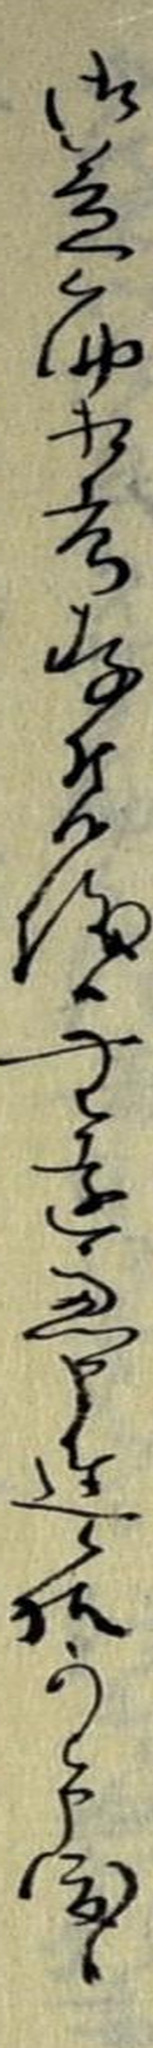御益筋相考存付候儀は無遠慮申達候様可被申渡候
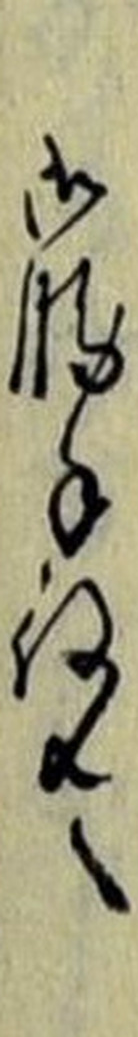御勝手役共へ
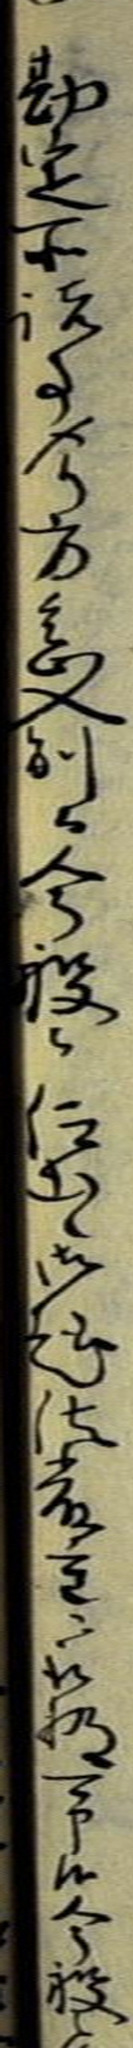〇勘定所諸事〆り方念入別而今般被仰出候御趣法厳重に取扱可申候今般之儀は
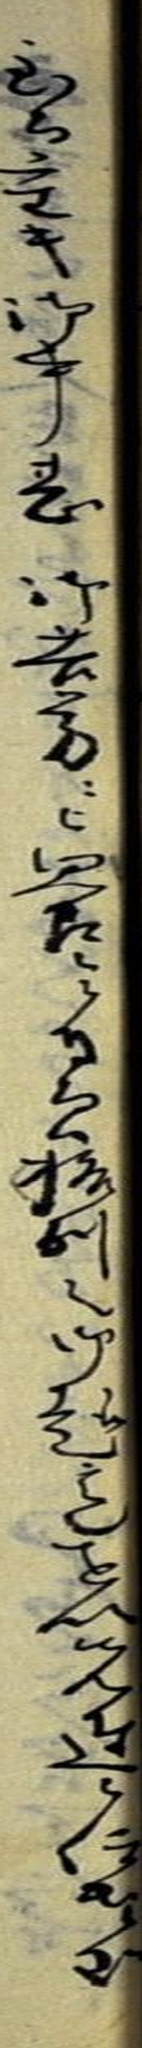至而重き御事甚御苦労に被思召候に付而は格別之御趣意を以先達被仰出候処
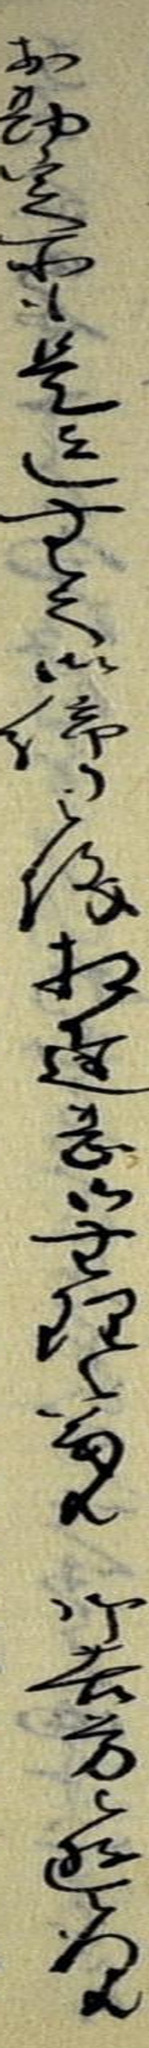於勘定所も是迄無之御締り之儀相達甚御無理之義共御苦労被遊候得共
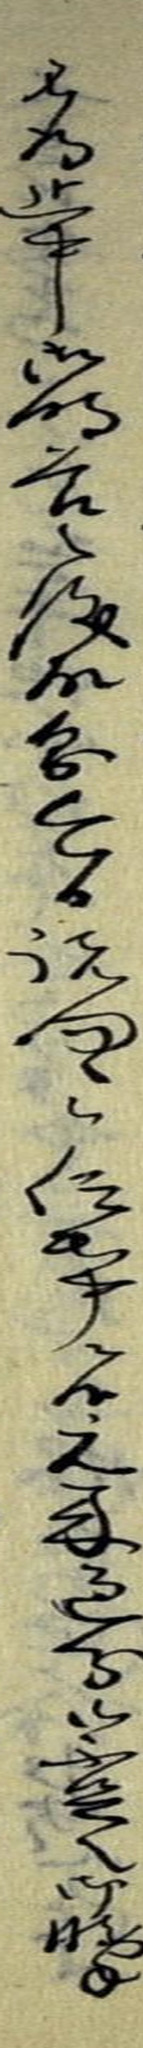不得止事御時節之儀故則今日諸向へ被仰出事に候元来過分御不足之御勝手
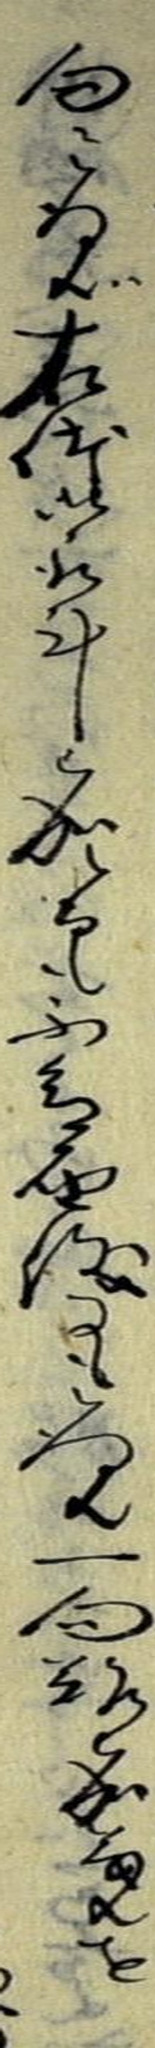向に候得共右体御取斗被成候而も不届儀にも候得共一向難被成義共を
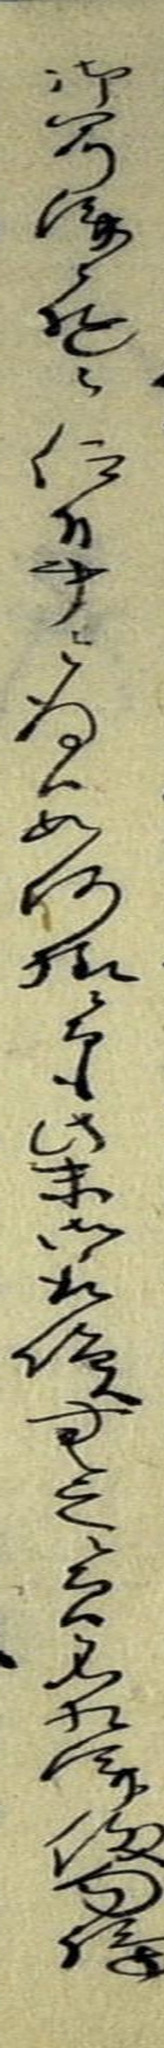御済被遊被仰付事に候得は如何様に而も此末御取続無之候而は不相済儀勿論
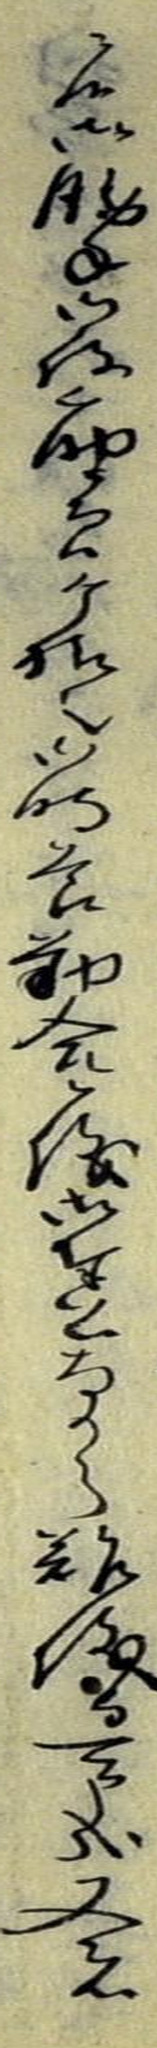に候御勝手御役筋に而はケ様之御時節勤合候儀御奉公なから難儀与可申哉又は
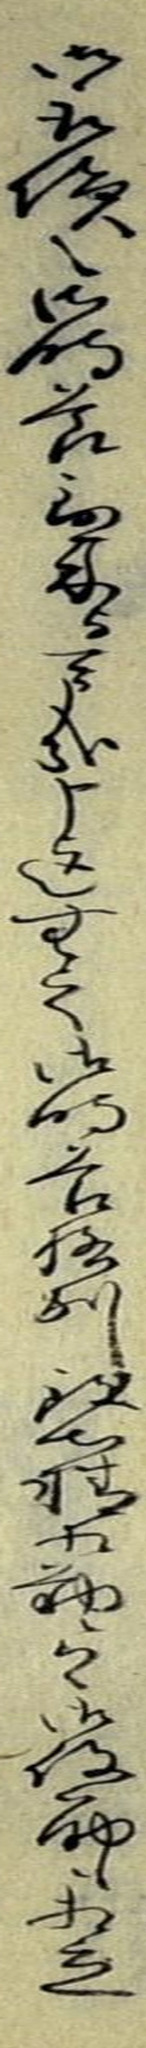御取続之御時節到来与可申哉申迄無之御時節格別致出精相勤候はゝ御役筋も相立
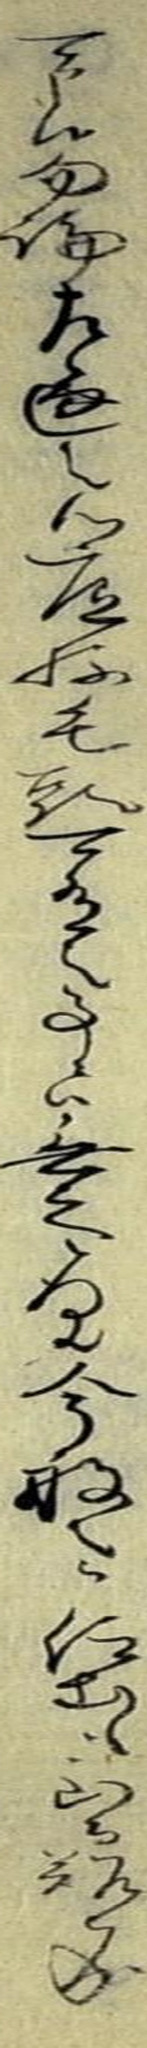可申候勿論左之通之心底抔毛頭可有之事には無之候得共今般之被仰出も至而難被成
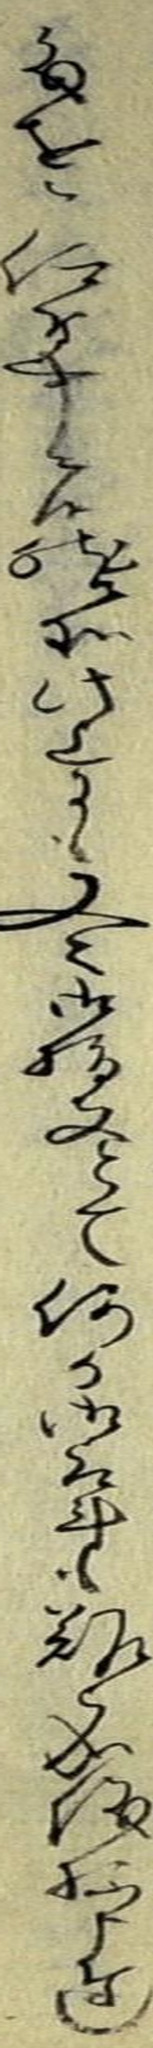義を被仰付事に候然る処此上にも又々御指支とて何か御取斗も難被成儀抔申達
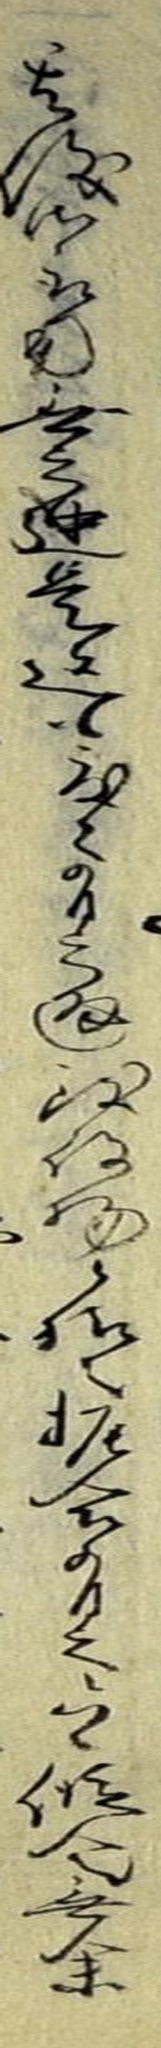其儀御取用無之迚是迄も度々有之通致役揚候様之振合有之候はゝ縦令無余
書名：命令之部 二
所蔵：福井県文書館 Fukui Prefectural Archives
